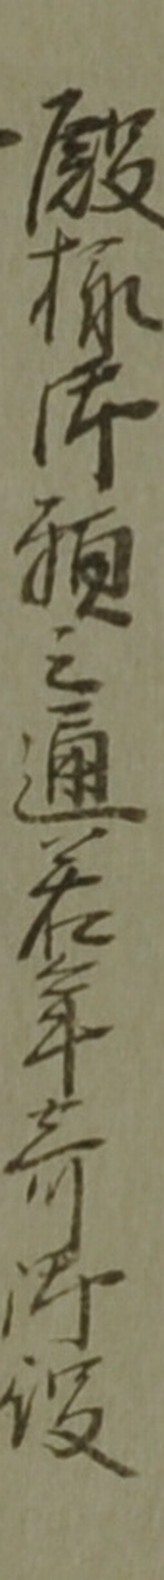殿様御願之通若年奇御役
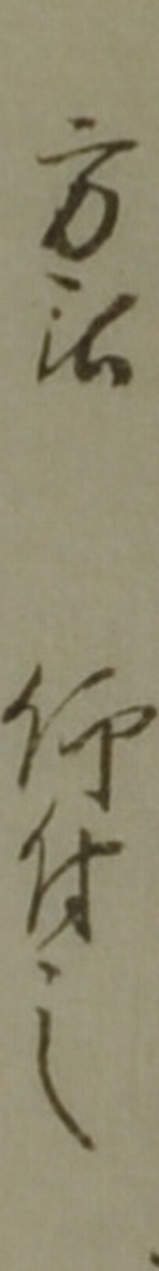方被仰付之
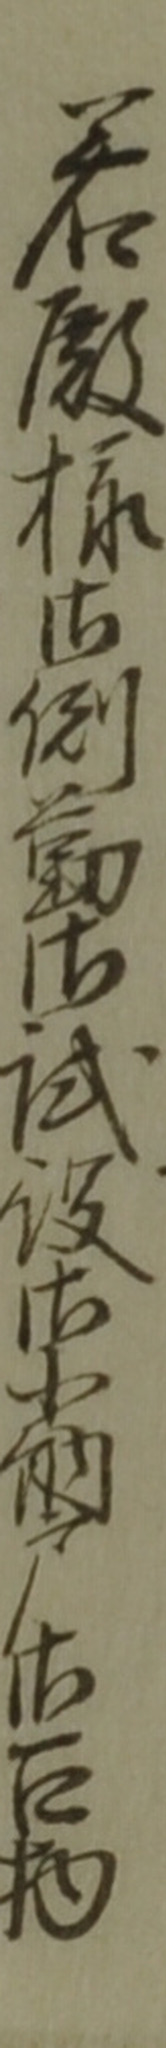若殿様御側勤御試役御小納戸御召物
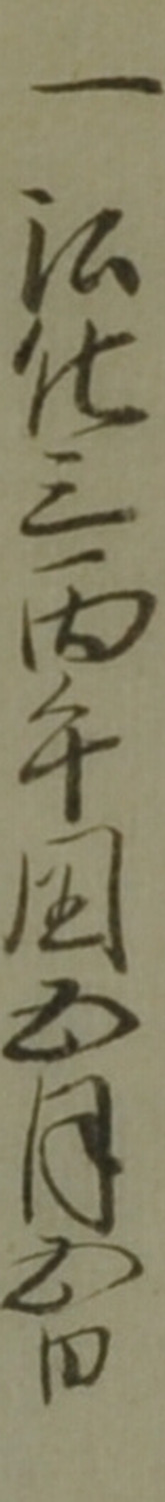一弘化三丙午閏五月五日
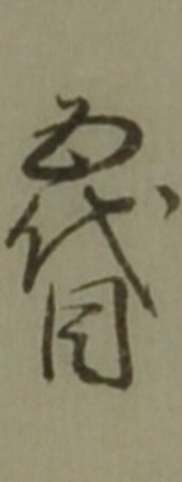五代目
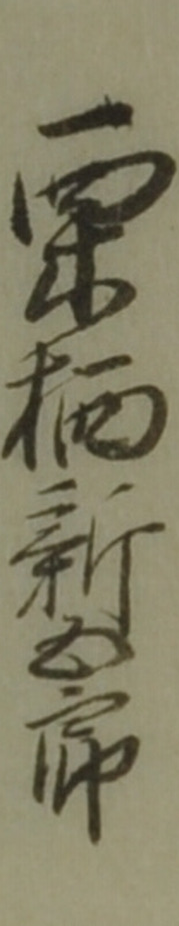栗栖新五郎
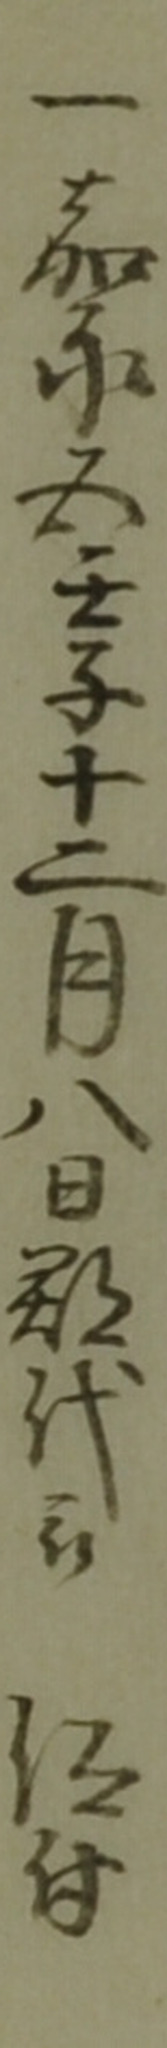一嘉永五壬子十二月八日郡代被仰付
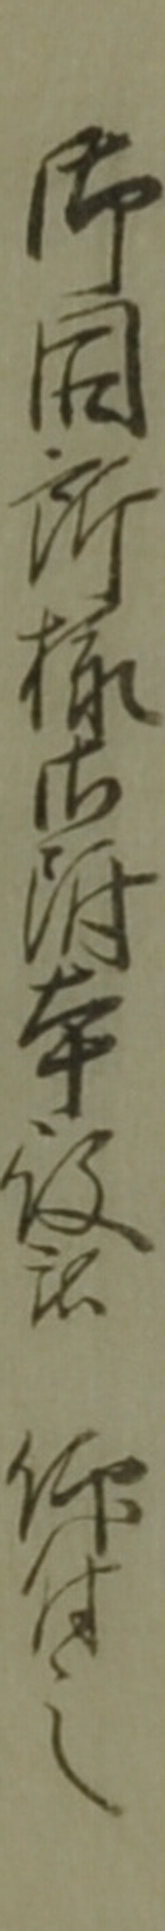御同所様御附本役被仰付之
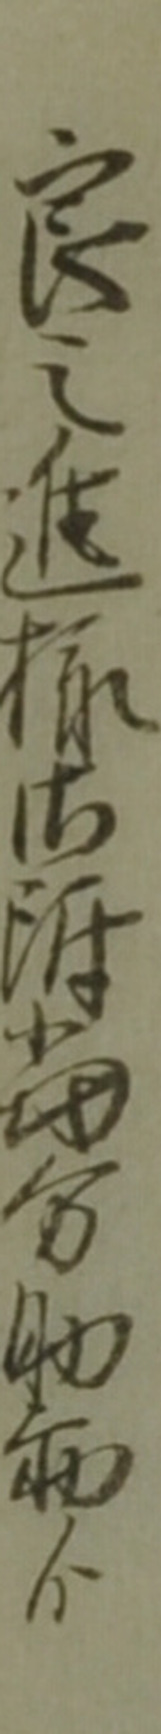良之進様御附当分助勤ゟ
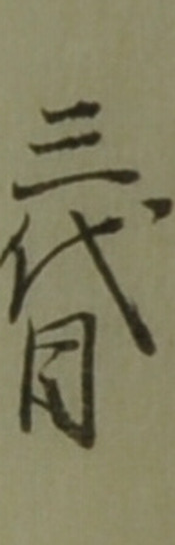三代目
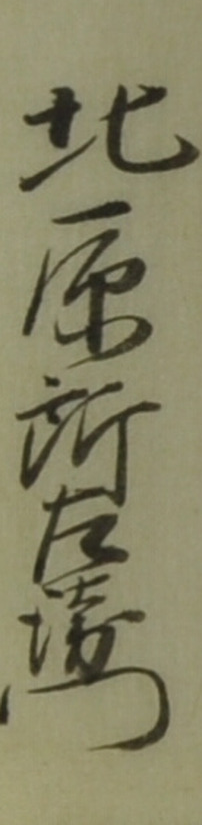北原所左衛門

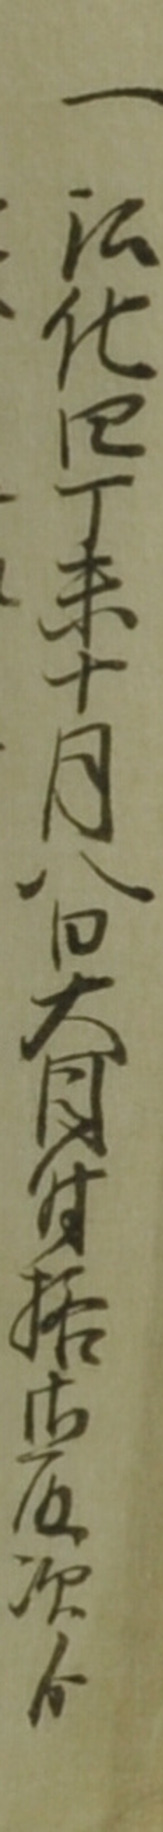一弘化四丁未十月八日大目付格御取次ゟ
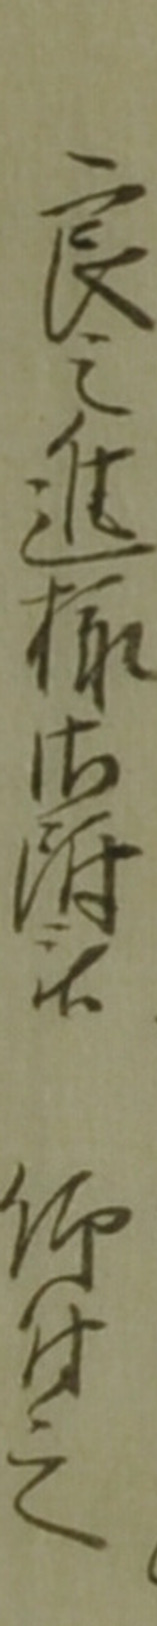良之進様御附被仰付之
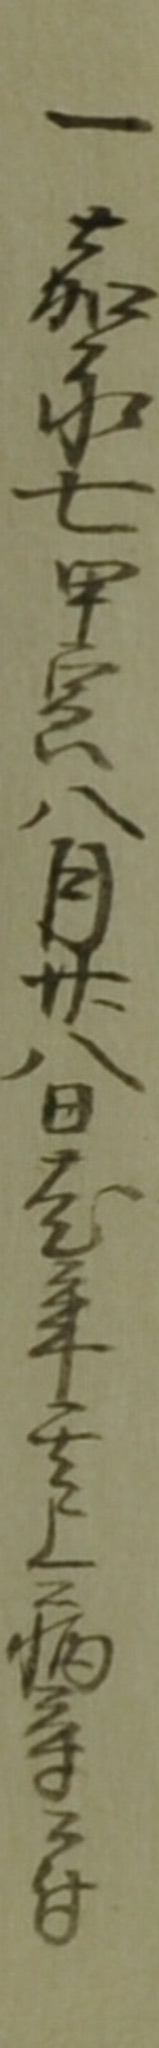一嘉永七甲寅八月廿八日老年其上病気ニ付
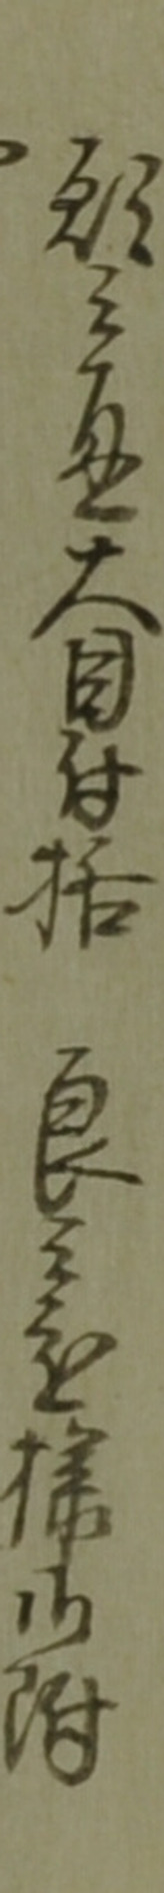願之通大目付格良之進様御附
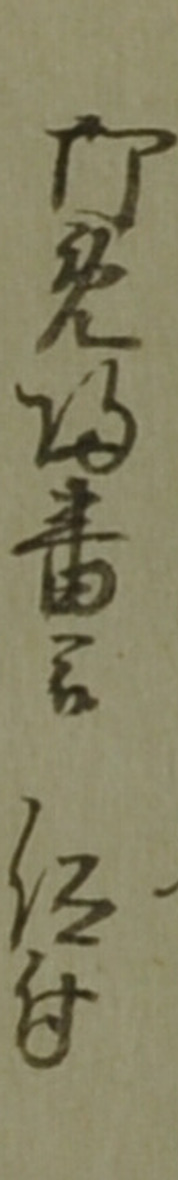御免帰番被仰付
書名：諸御役代々録（六）
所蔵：伊那市立高遠町図書館・合同会社AMANE
